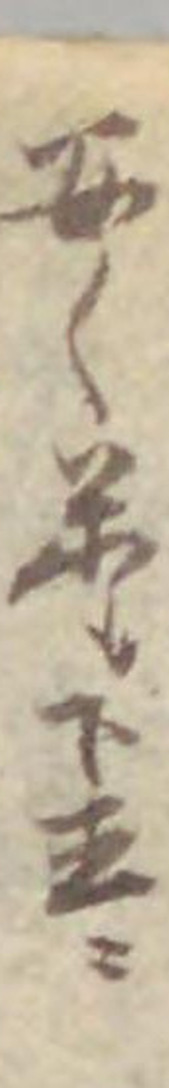安く米も下直二
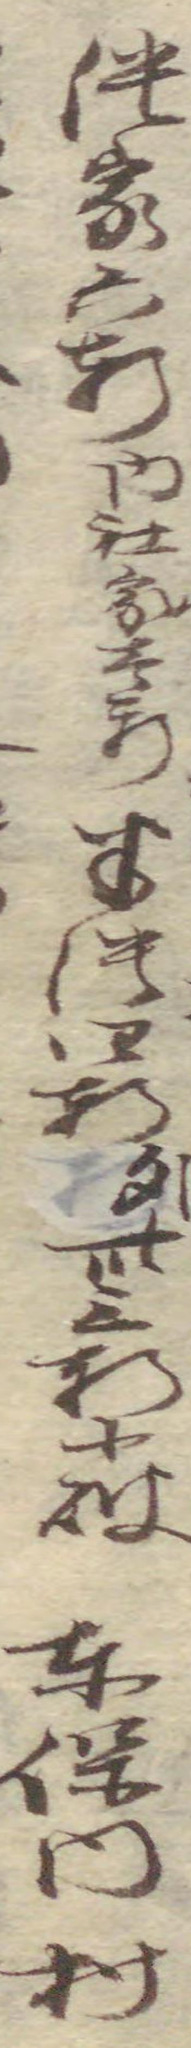一潰家六軒内社家壱軒半潰四軒外卅三軒小破東保内村
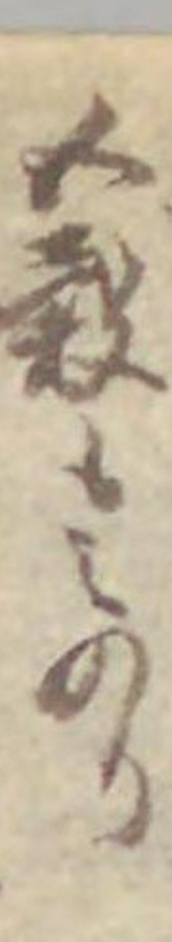五穀もミのり
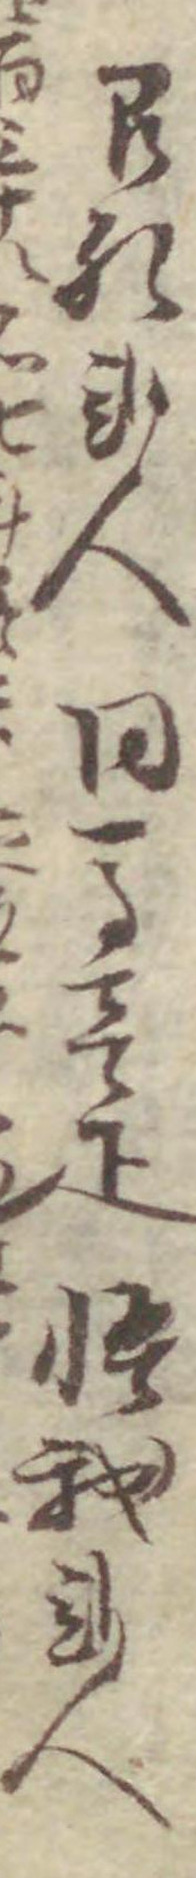即死弐人同馬壱疋怪我弐人
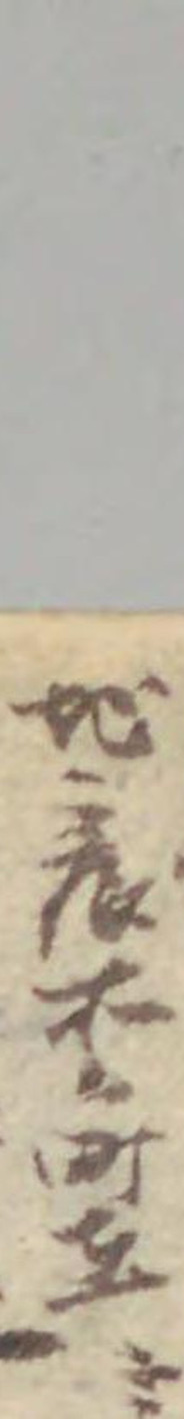地震所の町在
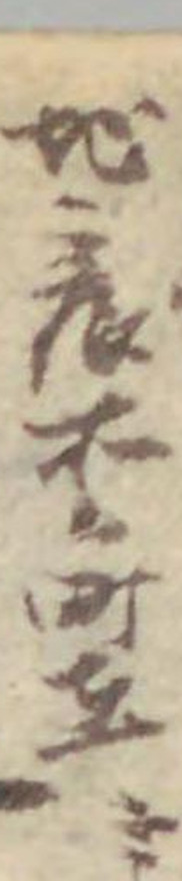地震所の町在
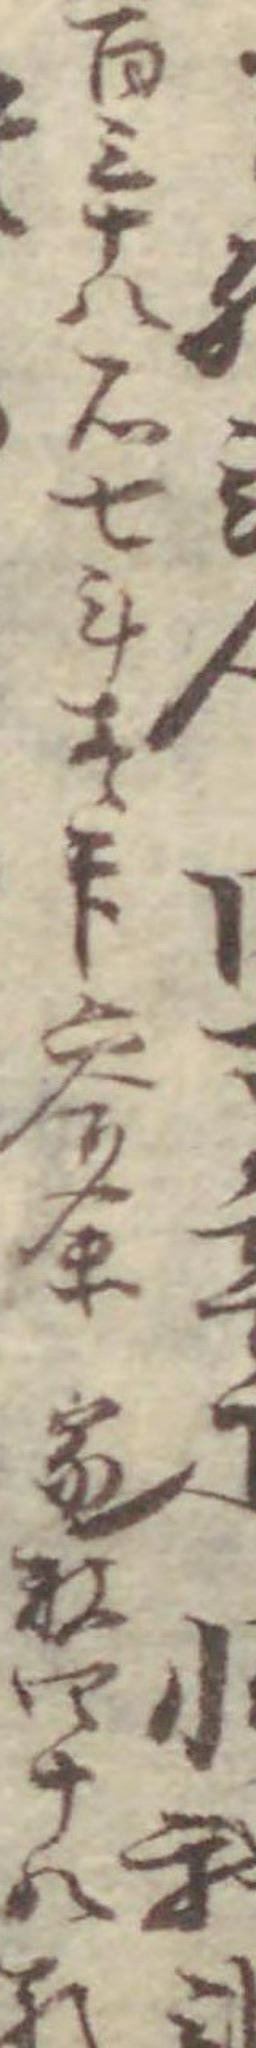高四百三十八石七斗壱升六合余家数四十八軒
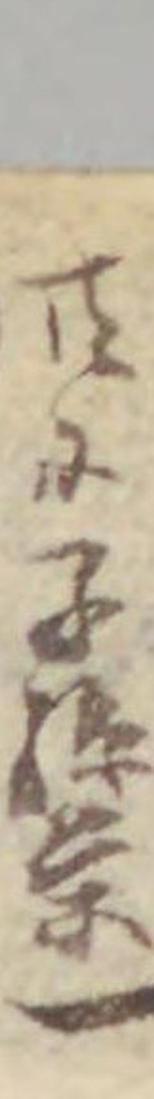共に子孫栄
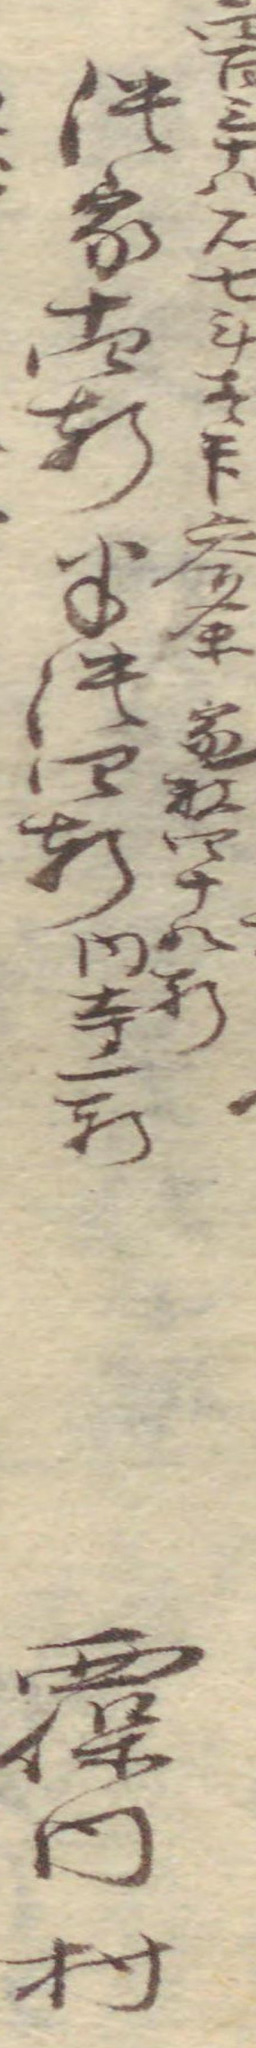一潰家十四軒半潰四軒内寺一軒西保内村
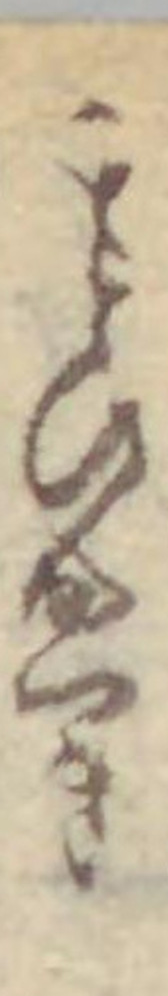もとひ成へき
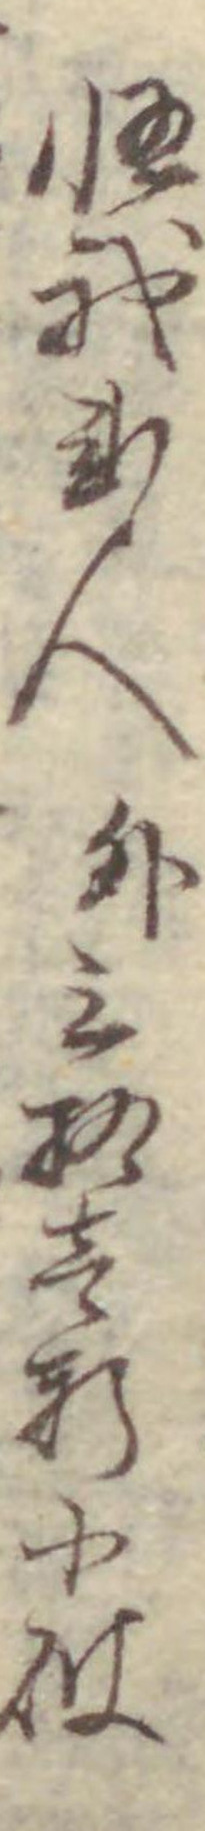怪我弐人外三拾壱軒小破
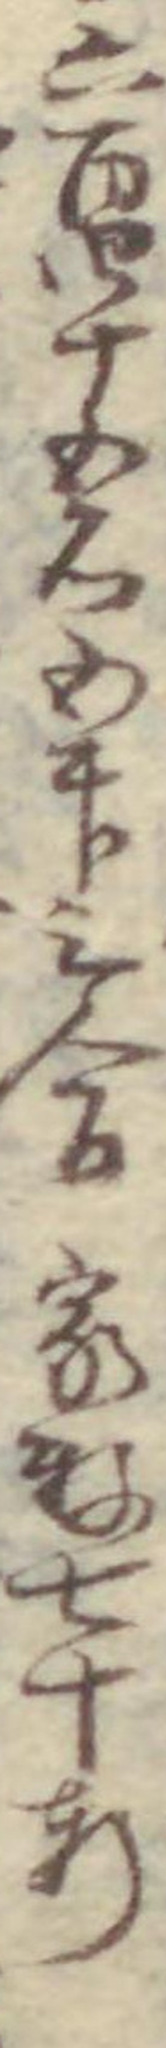高六百四十五石五升三合家数七十軒
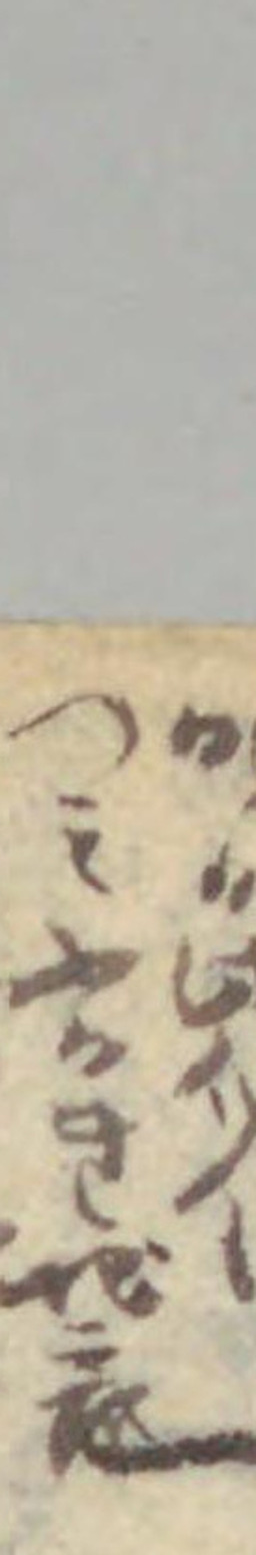つミふかき地震
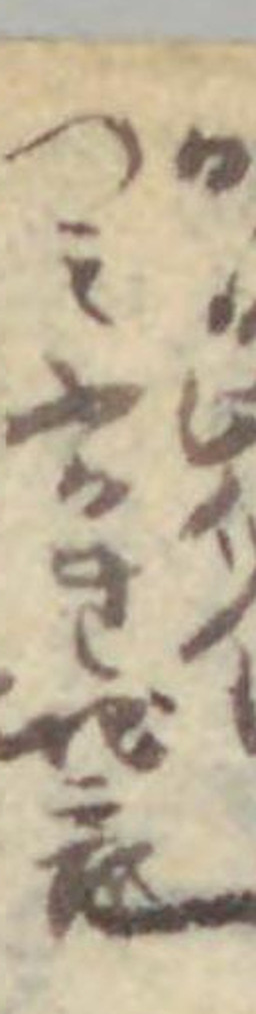つミふかき地震
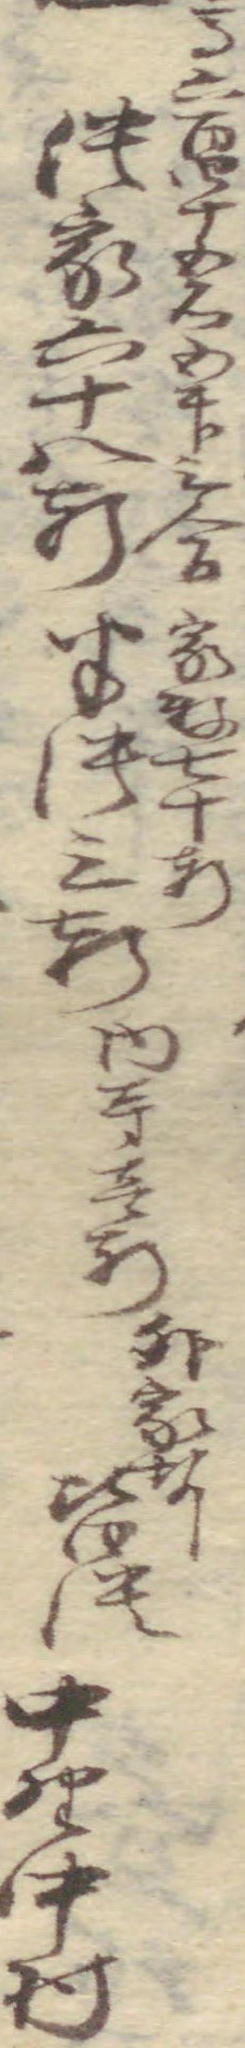一潰家六十八軒半潰三軒内寺壱軒外家なし皆潰中野中村
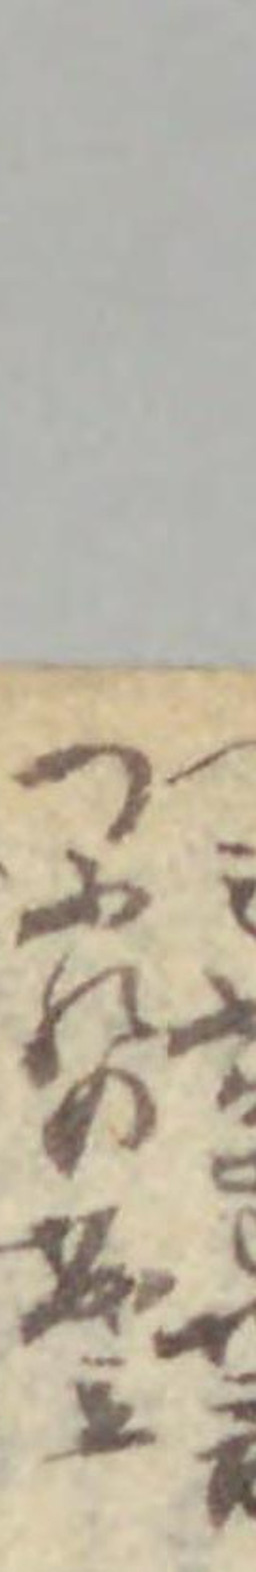つふれの掘立
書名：鶯宿雑記. 巻199-200
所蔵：国立国会図書館 National Diet Library, JAPAN
